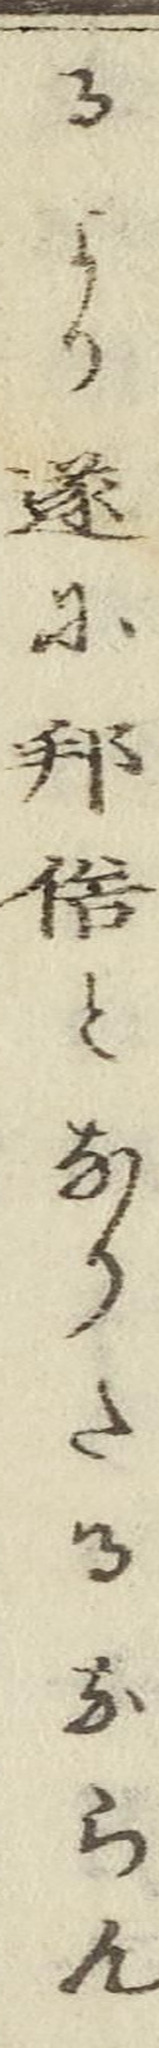るより遂に邦俗となりたるならん
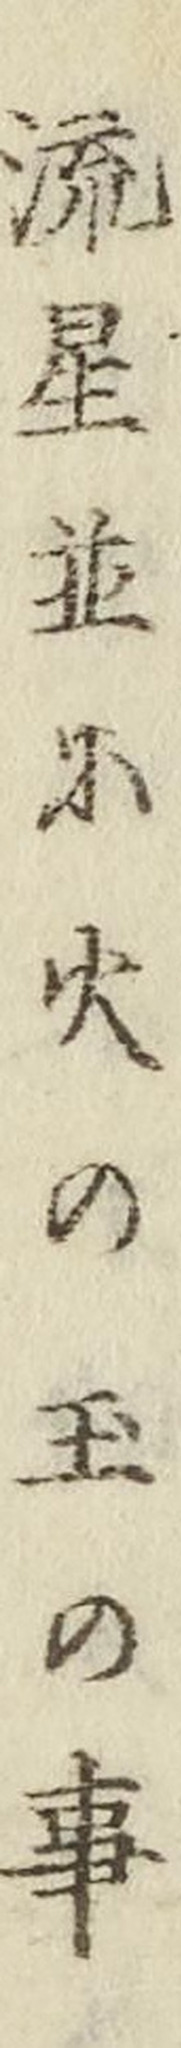流星並に火の玉の事
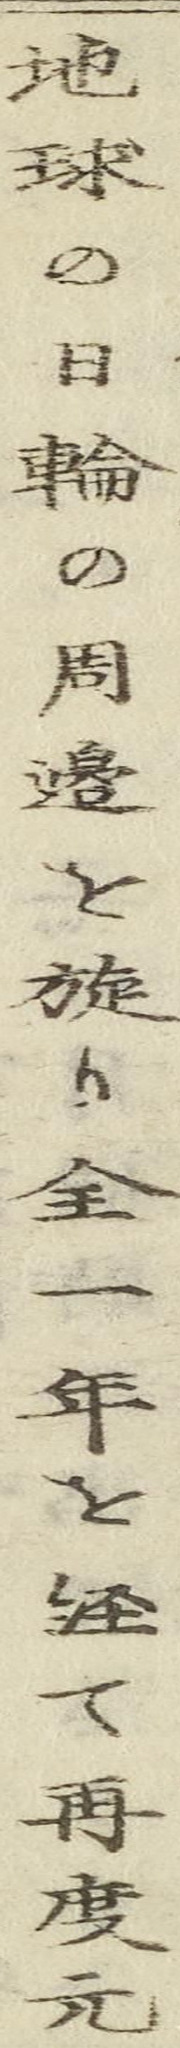地球の日輪の周辺を旋り全一年を経て再度元
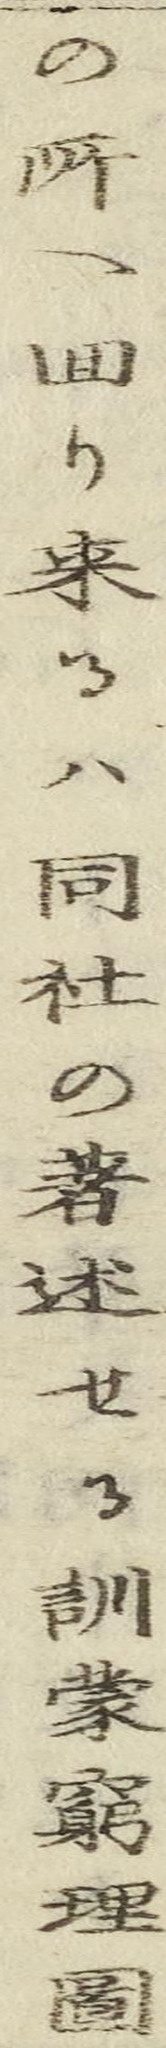の所へ回り来るは同社の著述せる訓蒙窮理図
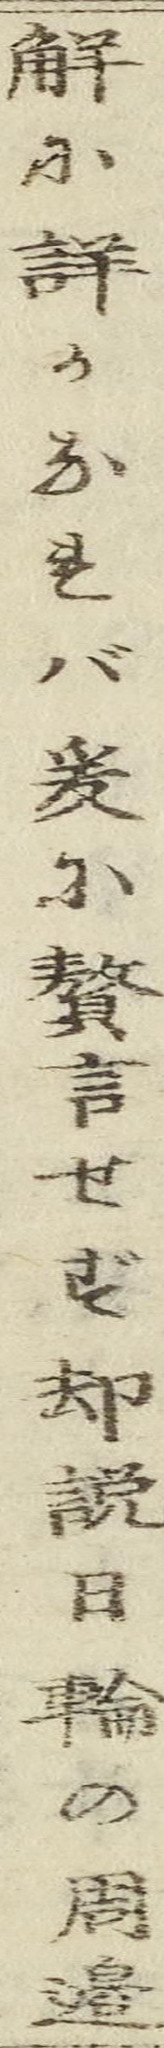解に詳かなれば爰に贅言せず却説日輪の周辺
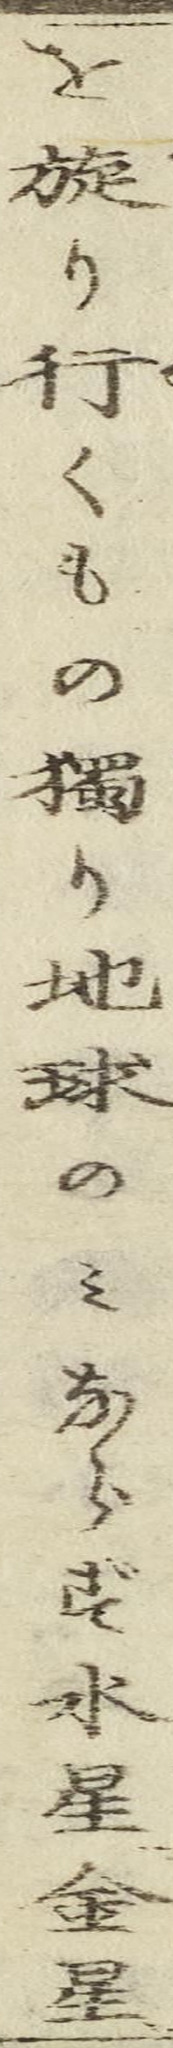を旋り行くもの独り地球のみならず水星金星
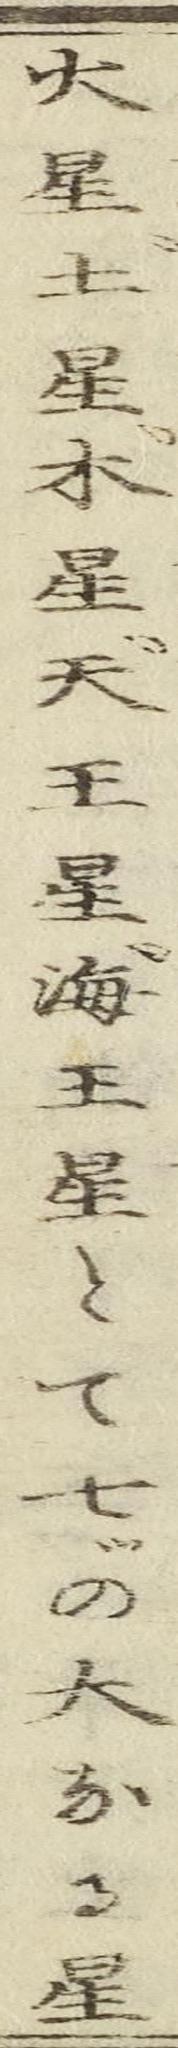火星土星木星天王星海王星とて七つの大なる星
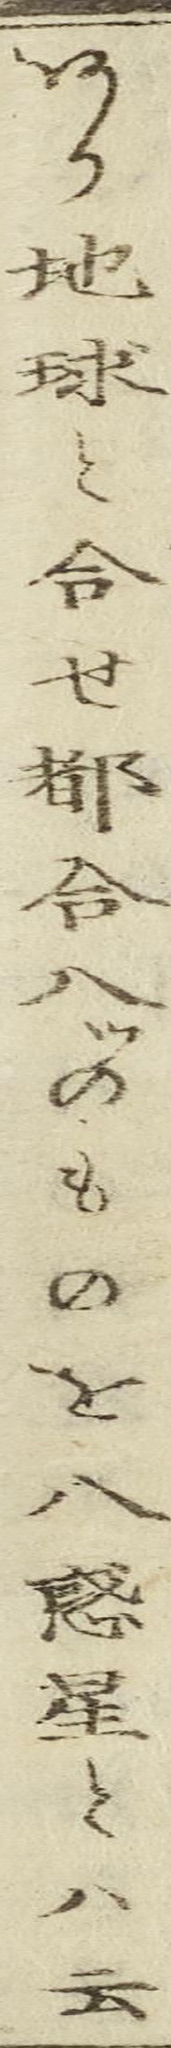あり地球と合せ都合八つのものを八惑星とは云
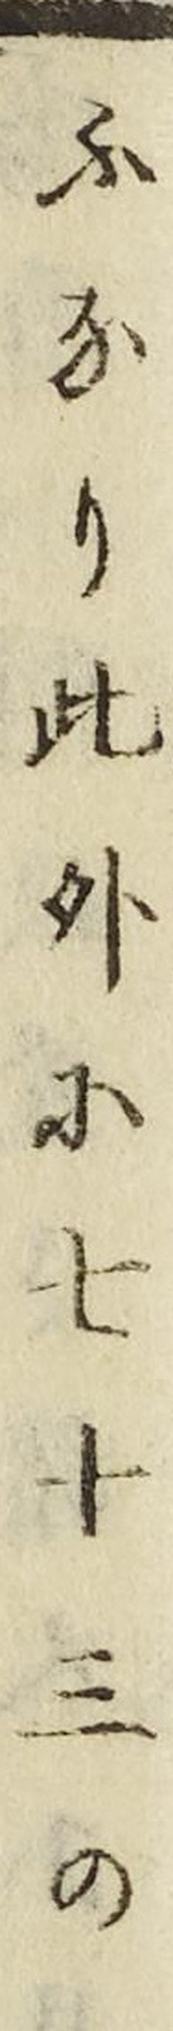ふなり此外に七十三の
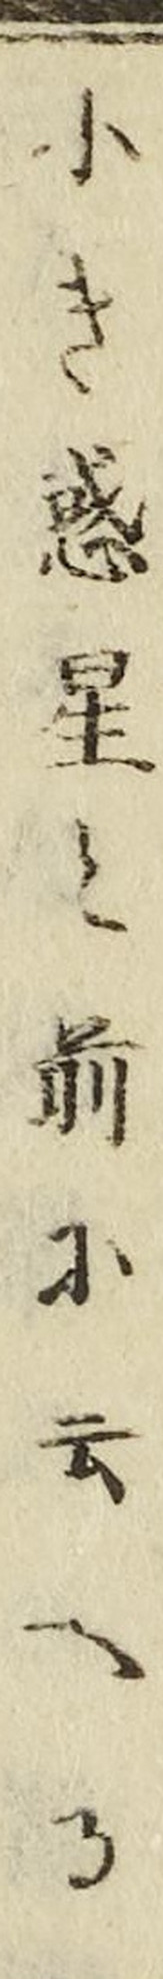小き惑星と前に云へる
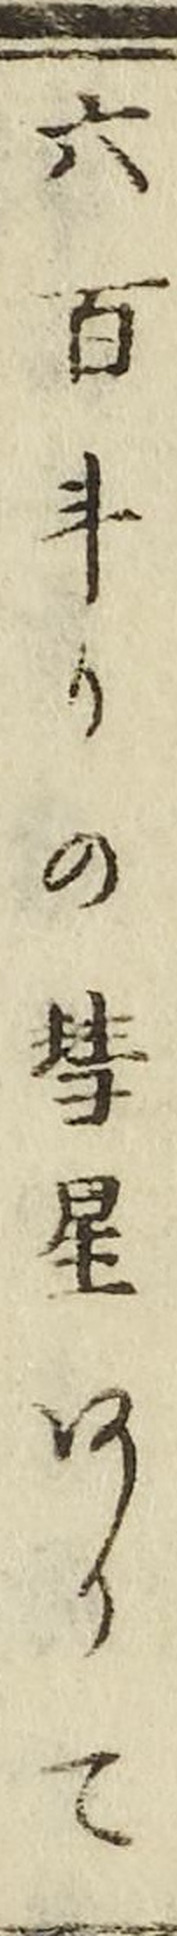六百計りの彗星ありて
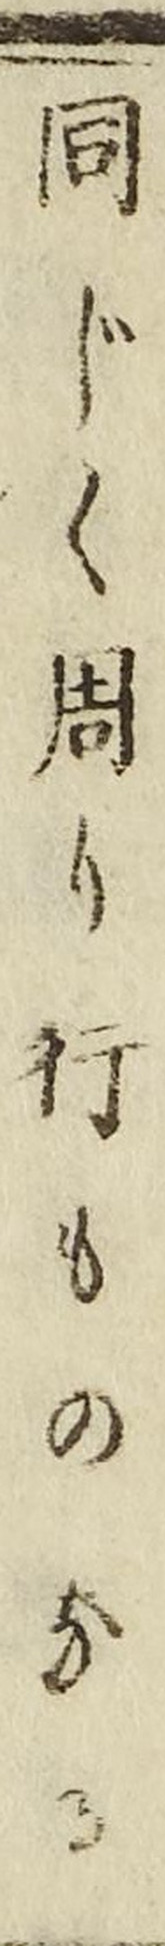同じく周り行ものなる
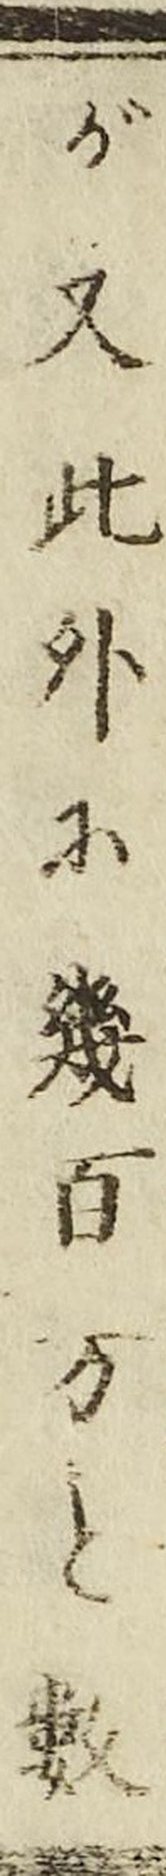が又此外に幾百万と数
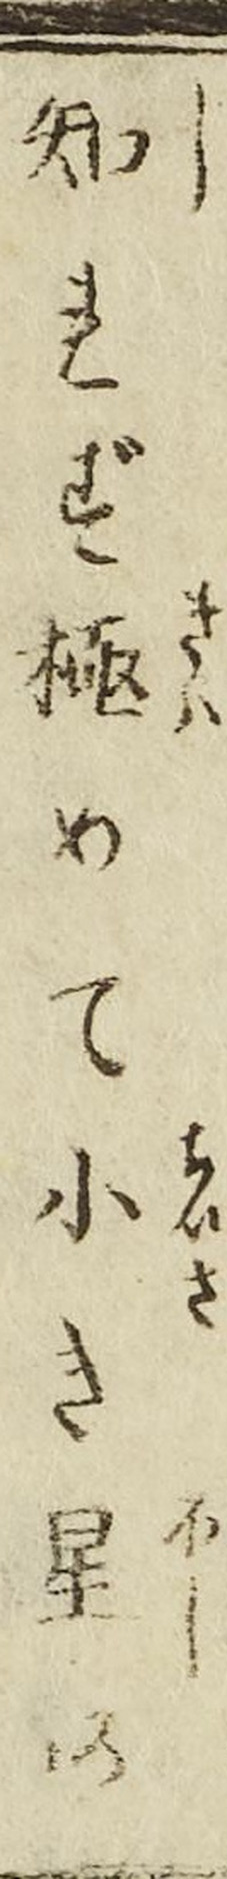知れず極めて小き星あ
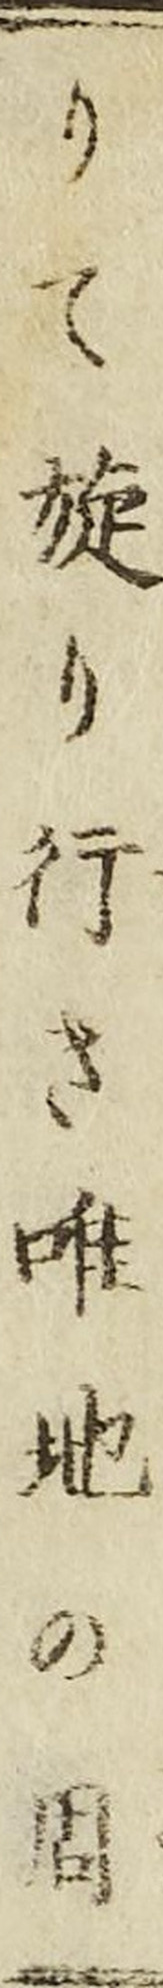りて旋り行き唯地の周
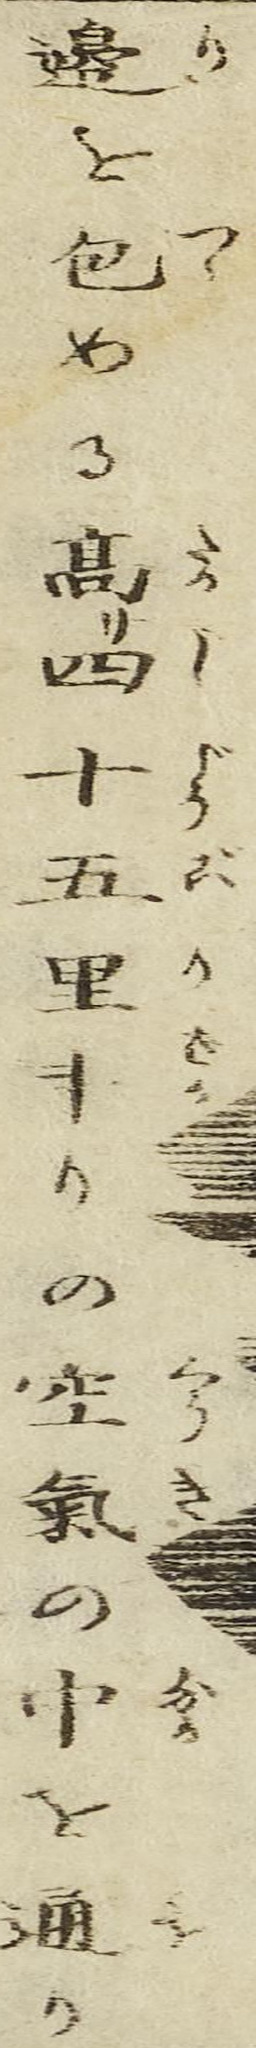辺を包める高さ四十五里計りの空気の中を通り
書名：天変地異
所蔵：東京大学地震研究所図書室 Earthquake Research Institute Library, The University of Tokyo, JAPAN
